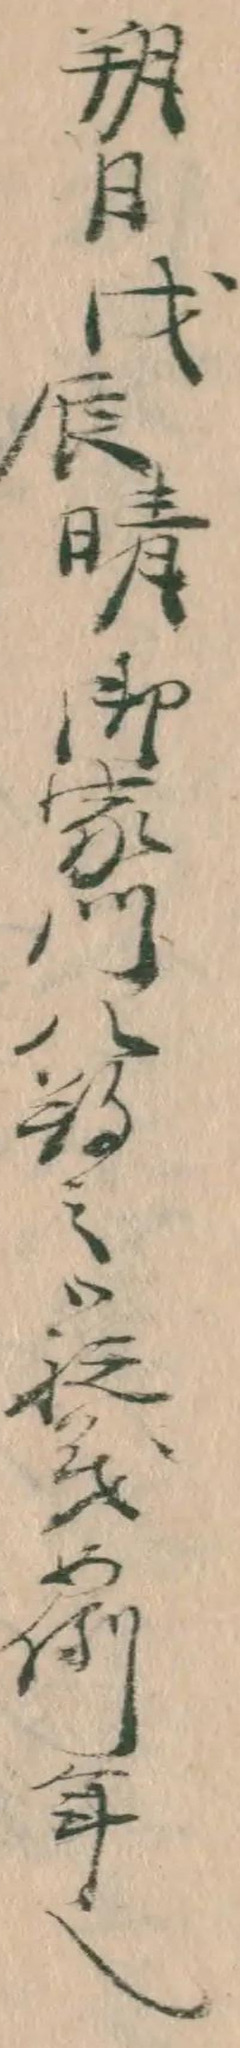朔日戊辰晴御家門八朔之御祝義如例年也
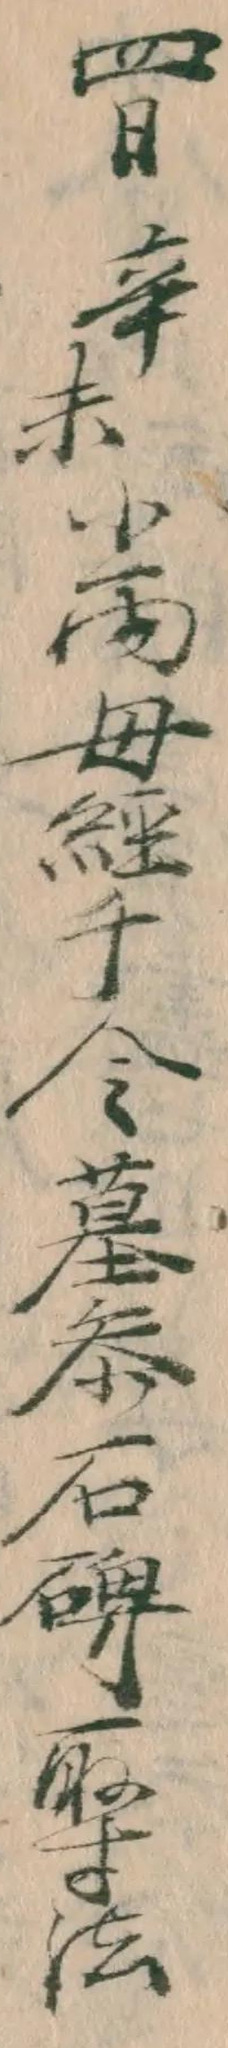四日辛未小雨母経千令墓参石碑取寸法
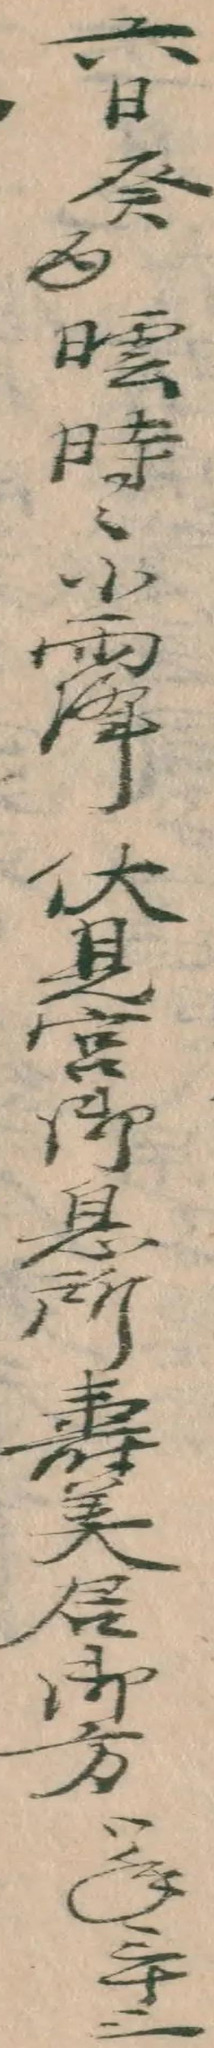六日癸酉曇時々小雨降伏見宮御息所壽美居御方御年三十二
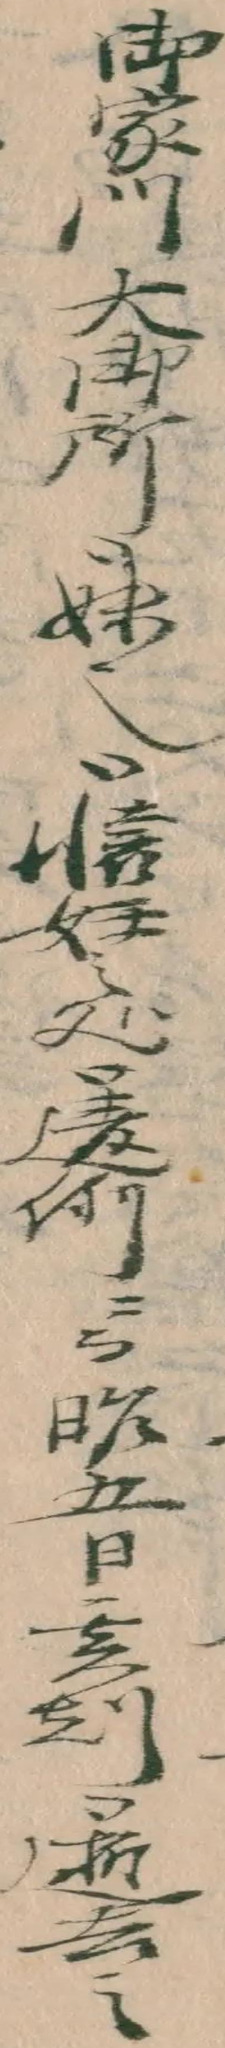御家門大御所御妹也御懐妊之処御違例ニ而昨五日亥刻御逝去之
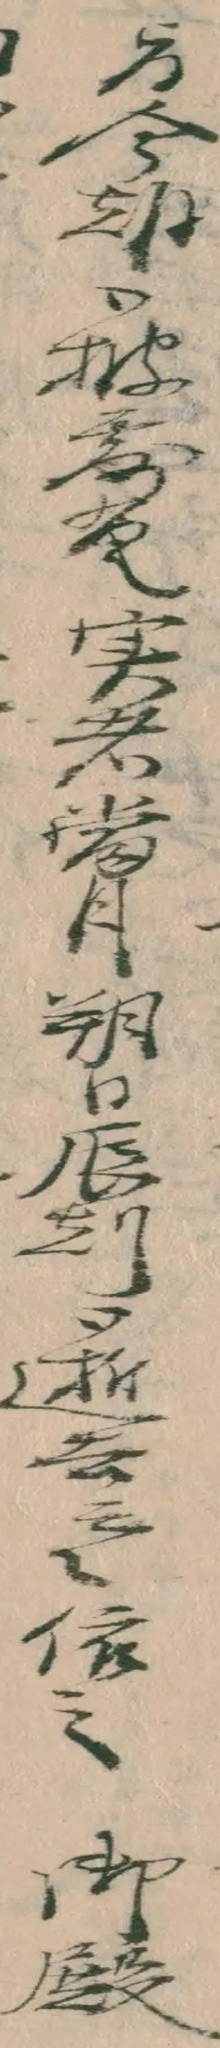旨今朝御披露有之実者當月朔日辰刻御逝去云々依之御殿
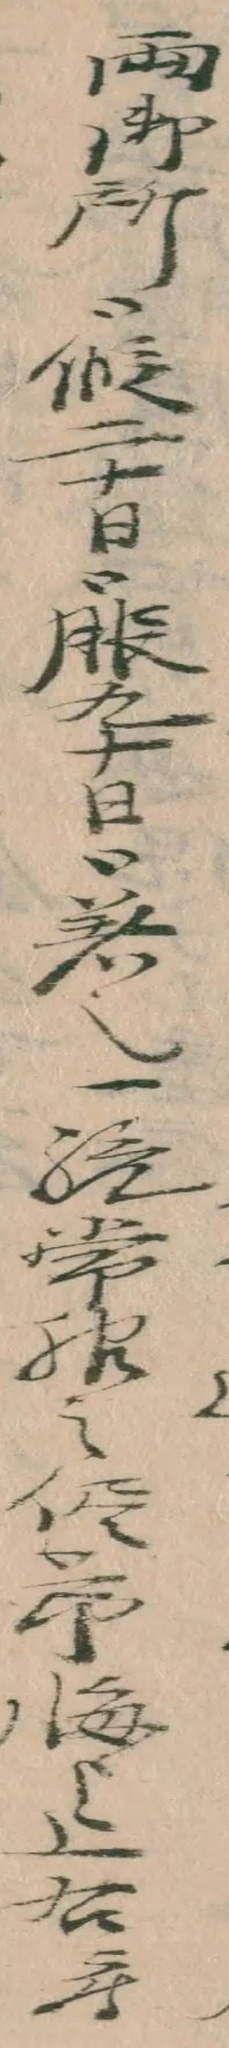両御所御假二十日御服九十日御着也一統常服之侭御即悔申上右ニ付
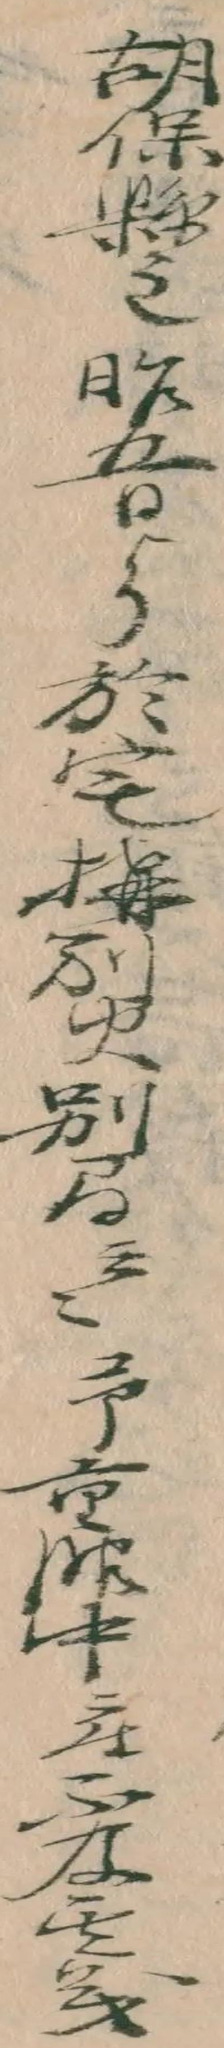胡保縣主昨五日より於宅構別火別間云々予重服中ニ付不及其義
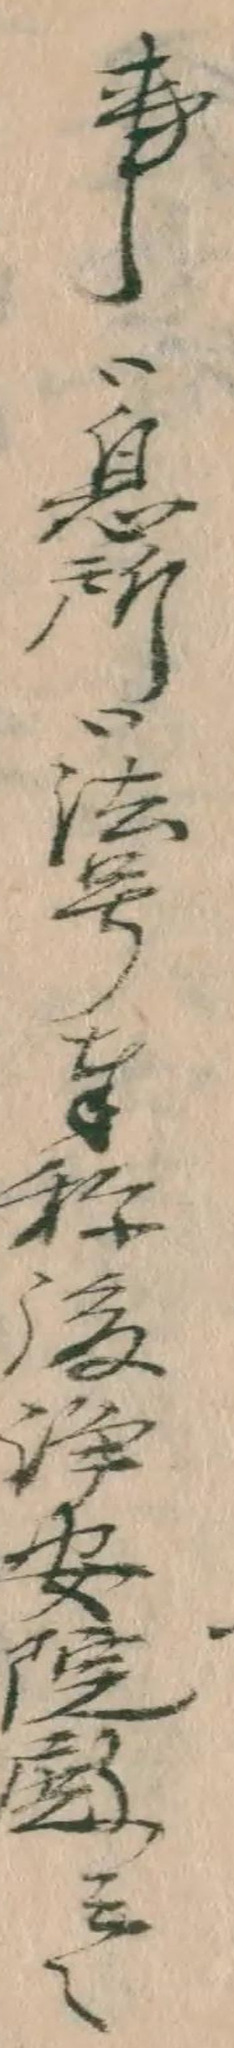事御息所御法号奉称後浄安院殿云々
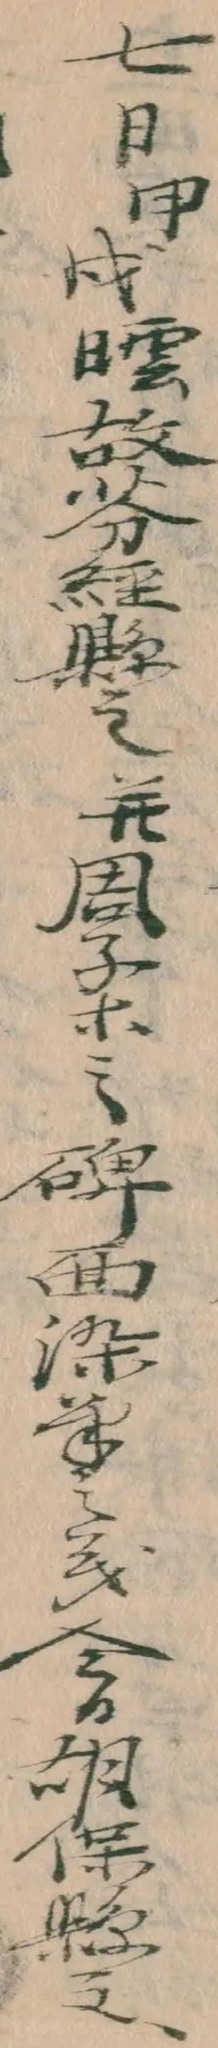七日甲戌曇故芬経縣之并周子等之碑面染筆之義今日胡保縣主
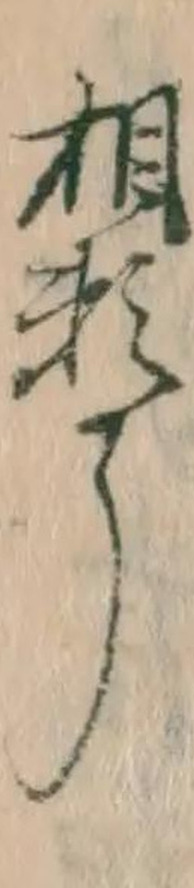相頼了
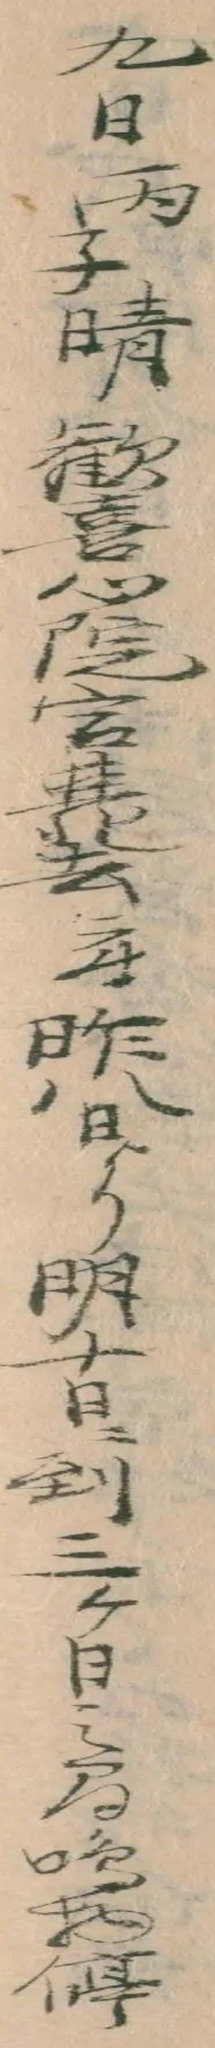九日丙子晴歓喜心院宮薨去ニ付昨八日より明十日に到三ケ日之間鳴物停
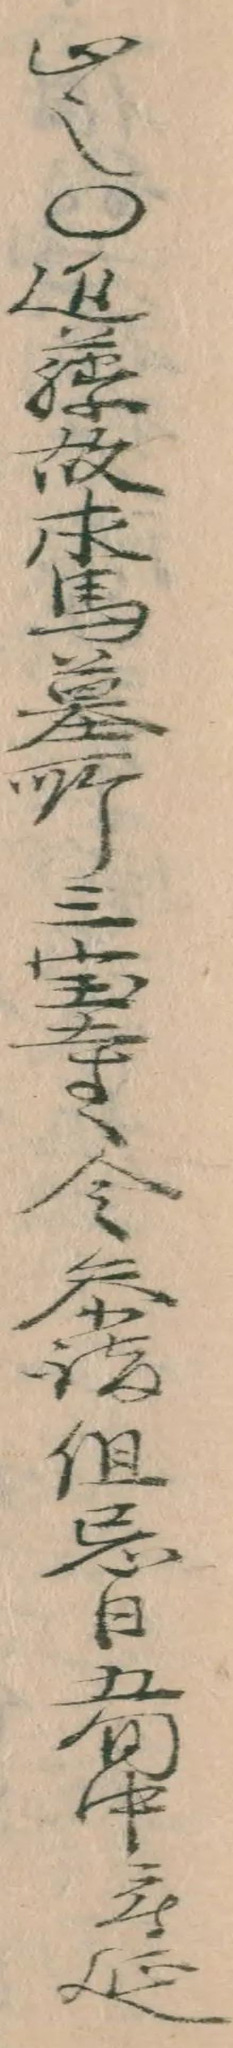正也○近藤故求馬墓所三宝寺へ令参詣但忌日五旬中ニ付延
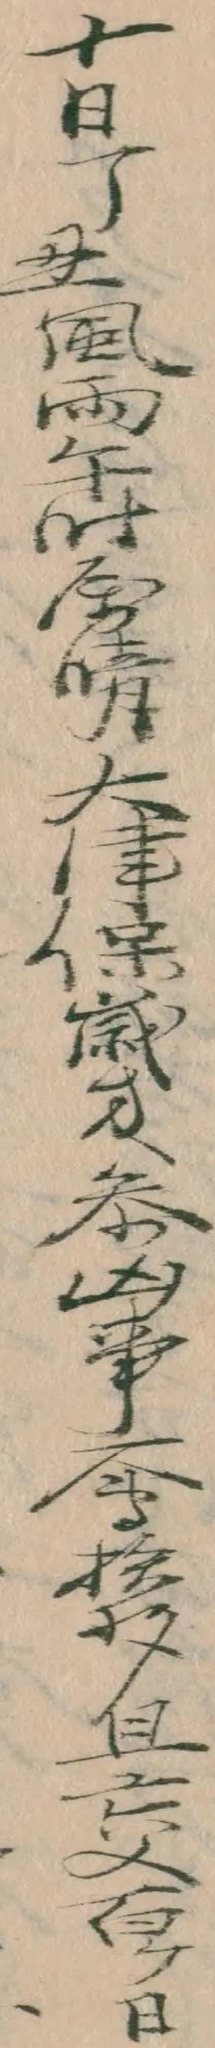十日丁丑風雨午時属晴大津保歳方へ参凶事一會挨拶且亡父百ケ日
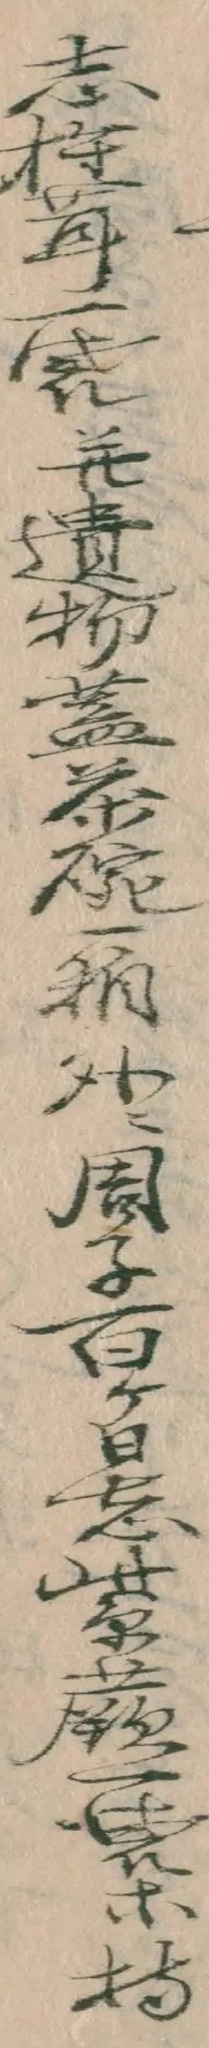志椎茸一袋并遺物蓋茶碗一箱外二周子百ケ日忘紫蕨一袋等持
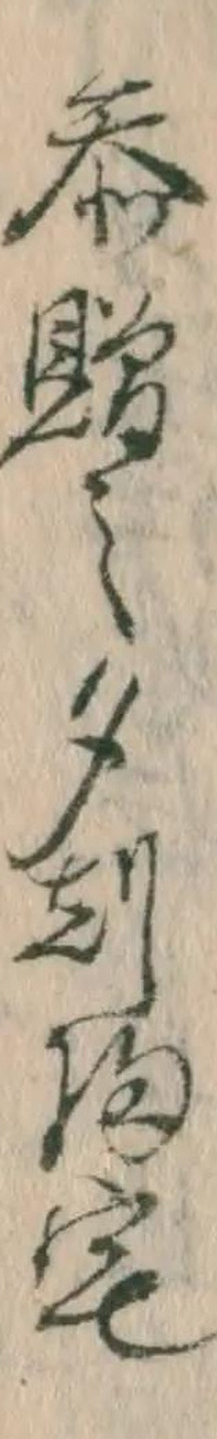参贈也夕刻帰宅
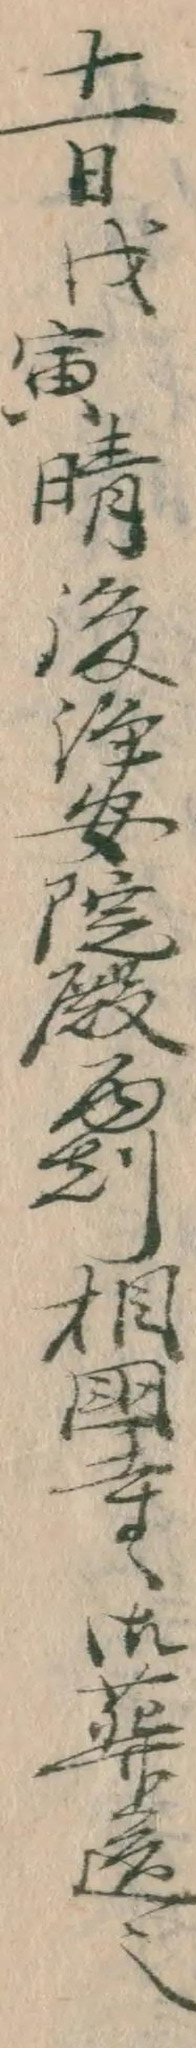十一日戊寅晴後浄安院殿酉刻相國寺へ御葬送也
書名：賀茂社記録. 第65冊
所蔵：国立国会図書館 National Diet Library, JAPAN
